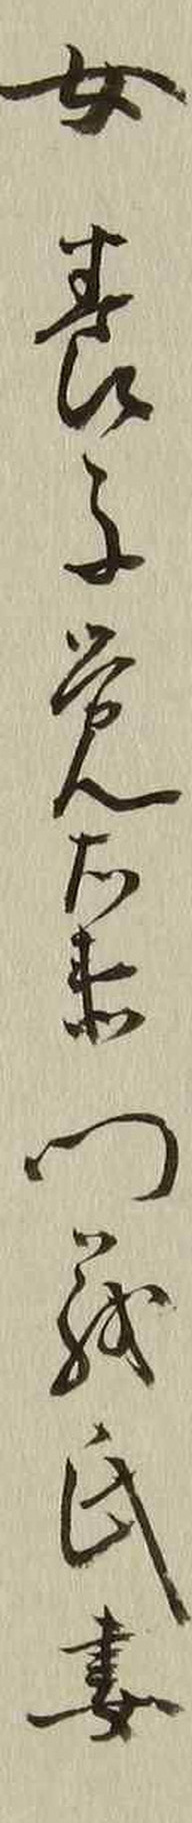女養子覚右衛門義氏妻
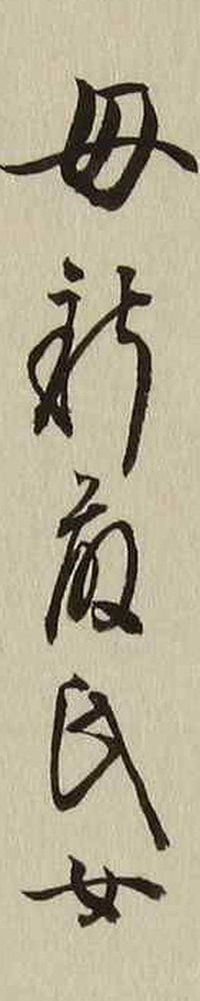母新藤氏女
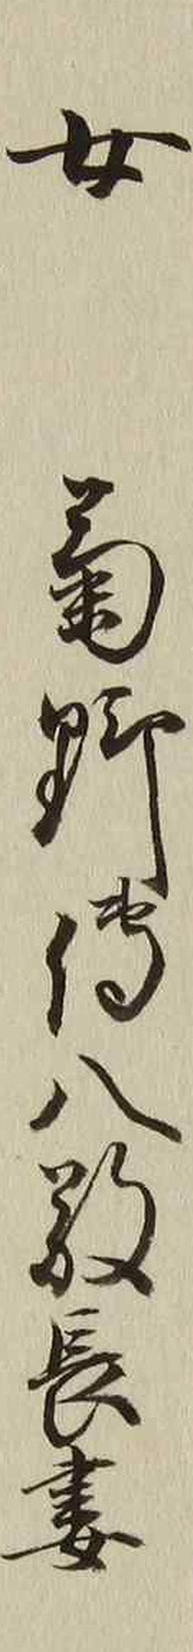女菊野伝八敬長妻
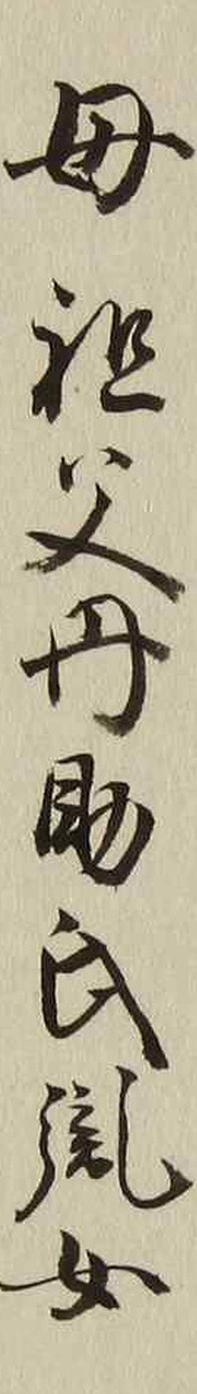母祖父丹助氏胤女
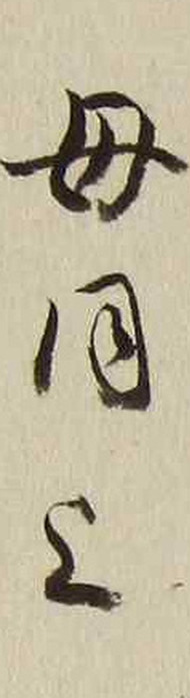母同上

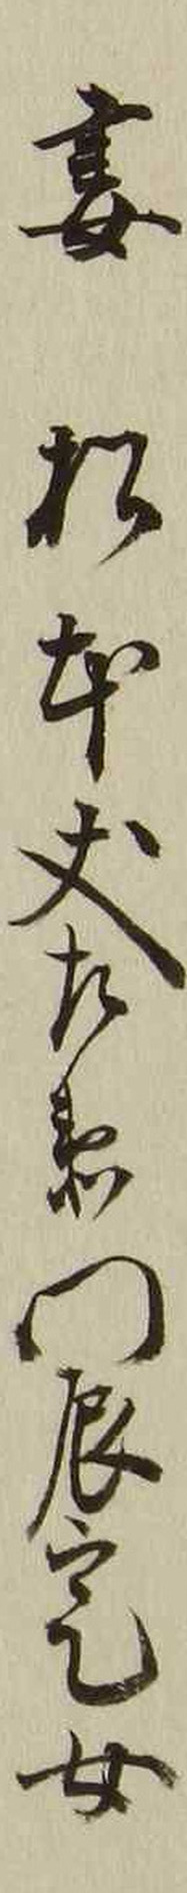妻松本丈左衛門辰定女
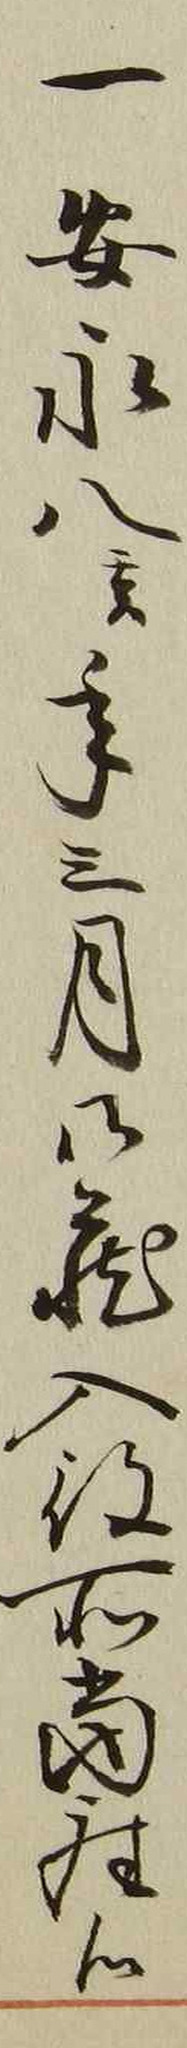一安永八亥年三月御蔵入役所当座候
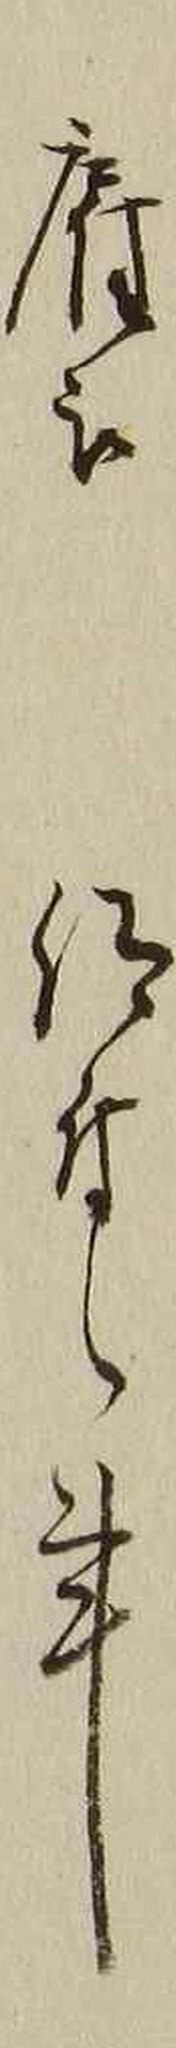雇被仰付候事
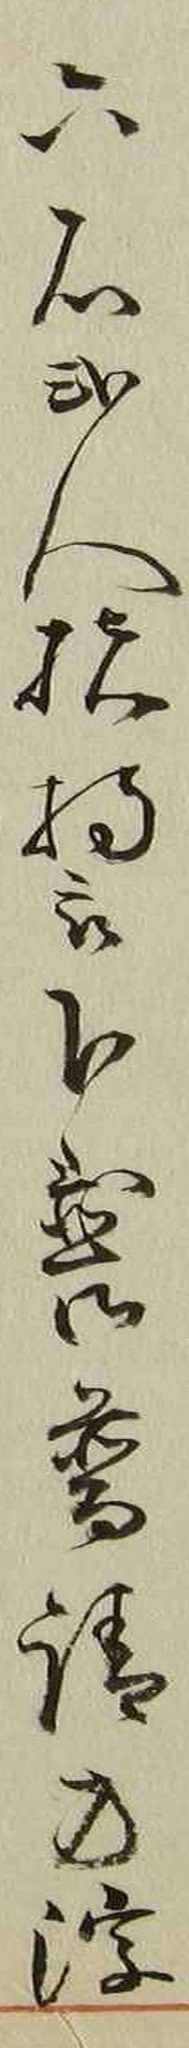六石弐人扶持被下置御普請方浮
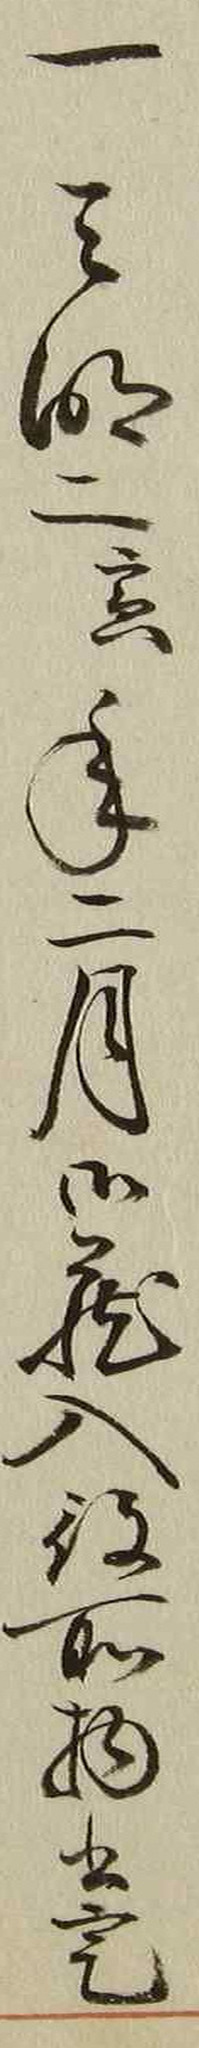一天明二寅年二月御蔵入役所物書定
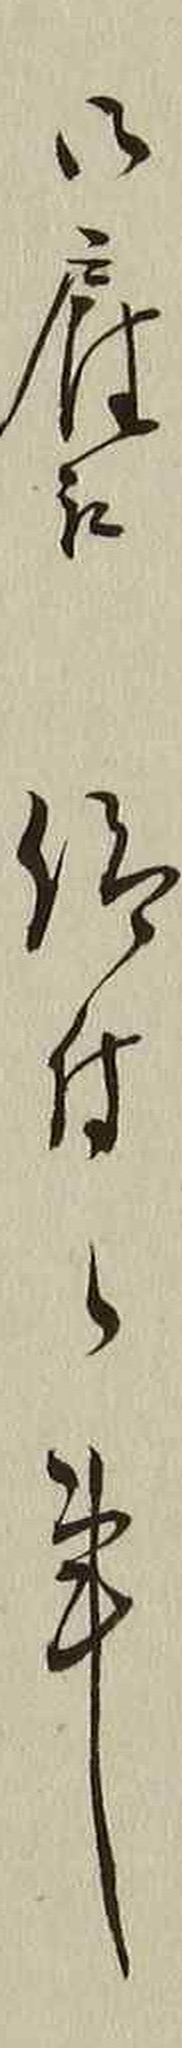御雇被仰付候事
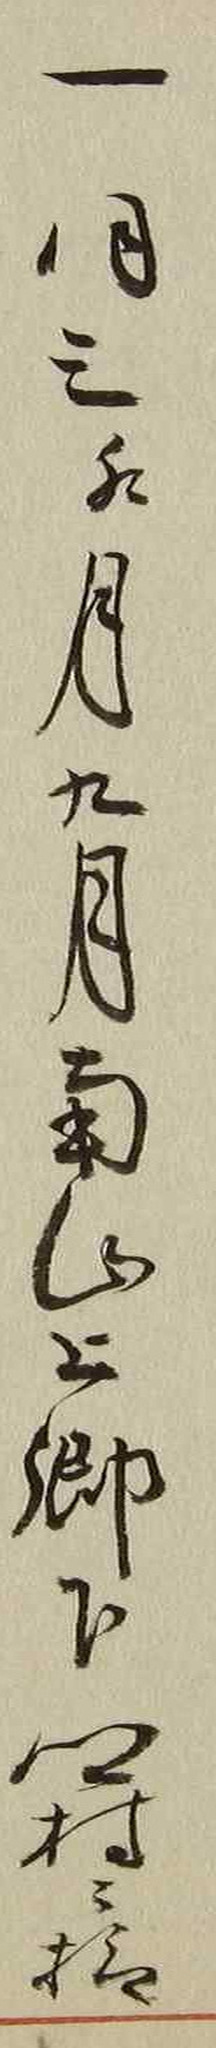一同三卯月九月南山上卿下郷村々検
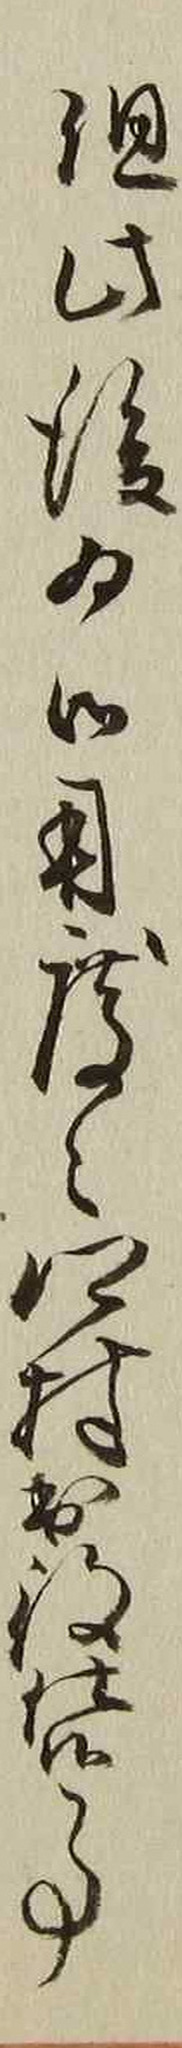但此後為御用度々郷村出役仕候事
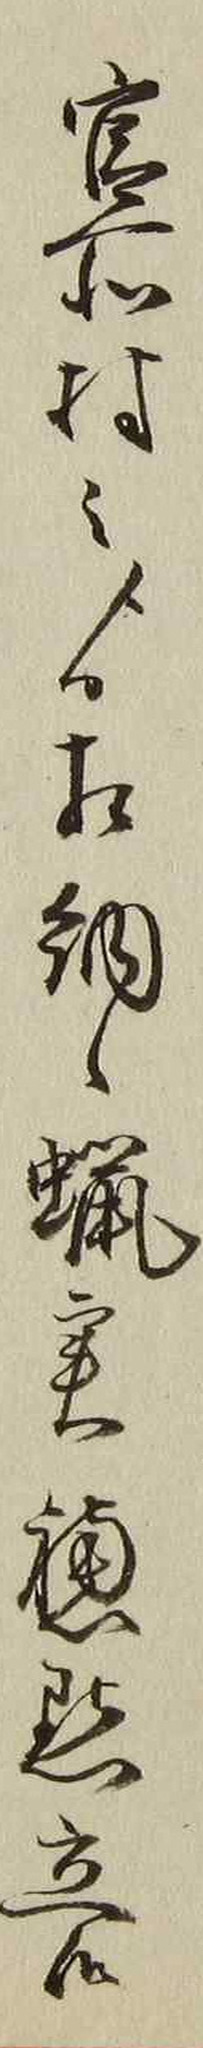官所村々ゟ相納候蝋実穂点立候
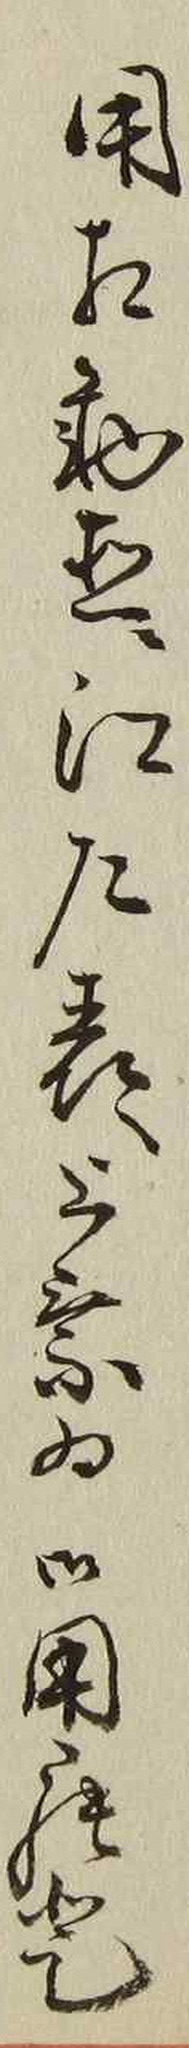用相勤直ニ江戸表へ上乗為御用罷登
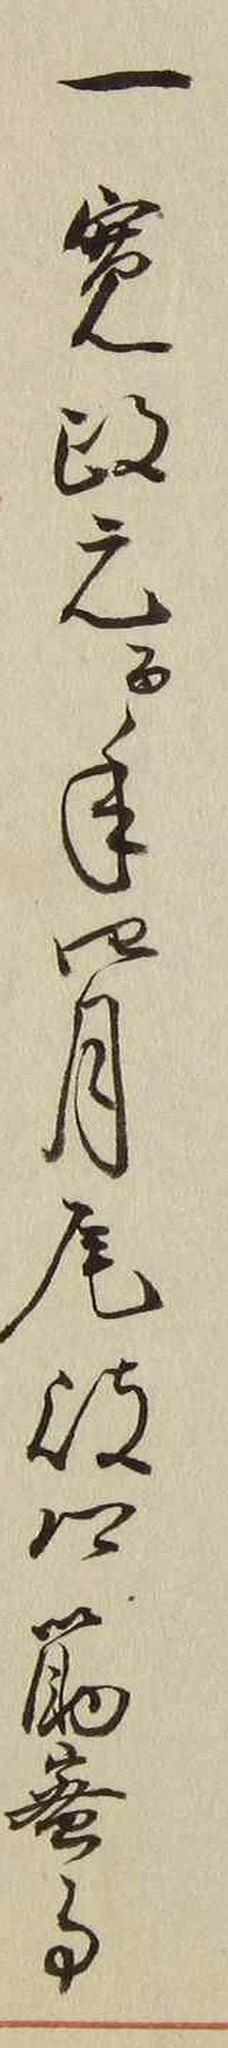一寛政元酉年四月尾岐郷筋密事
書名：諸士系譜　巻之57　ほ之部4
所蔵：会津若松市立会津図書館
